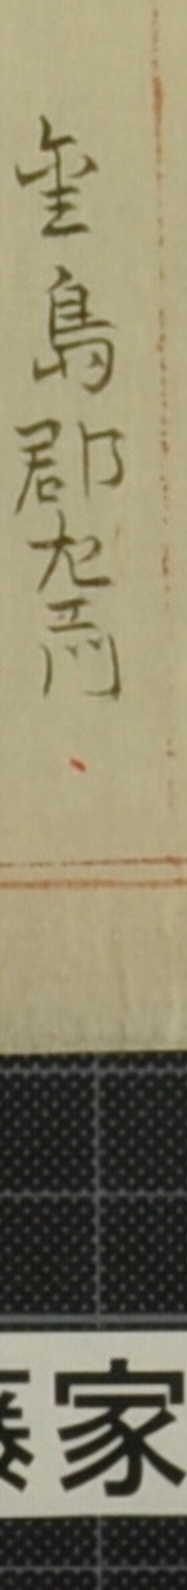矢島郡左エ門・
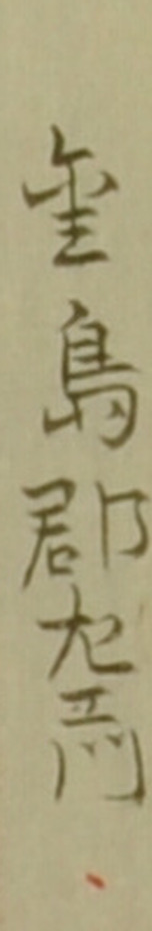矢島郡左エ門・
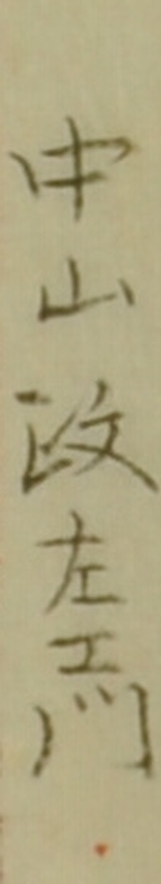中山政左エ門・
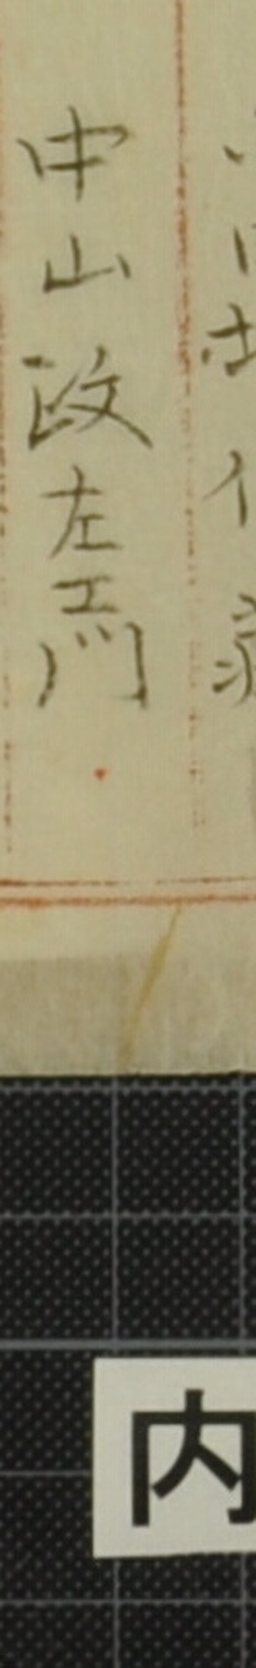中山政左エ門・
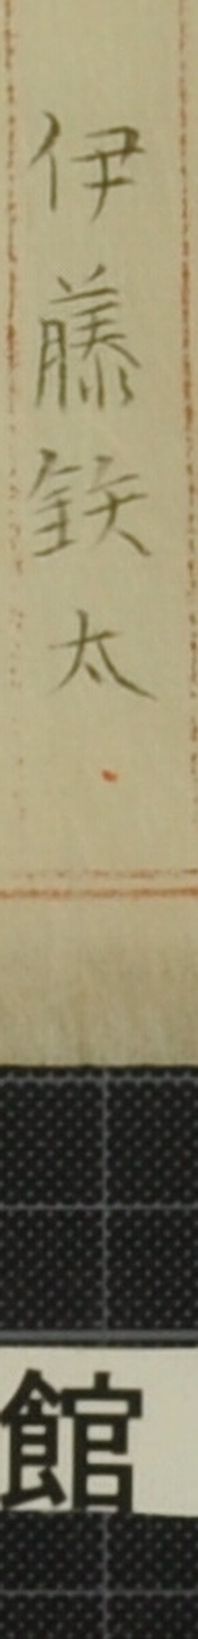伊藤鉄太・

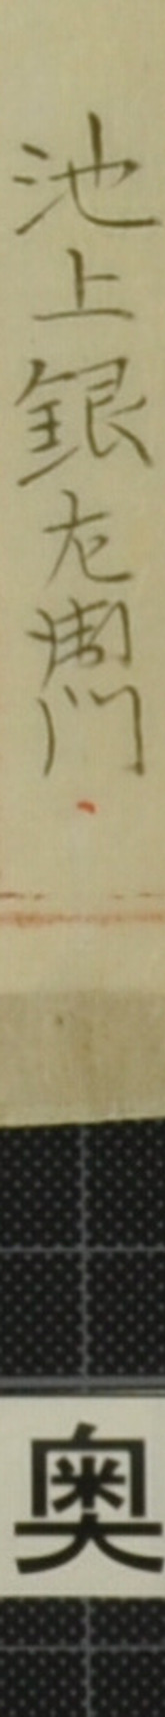池上銀左衛門・

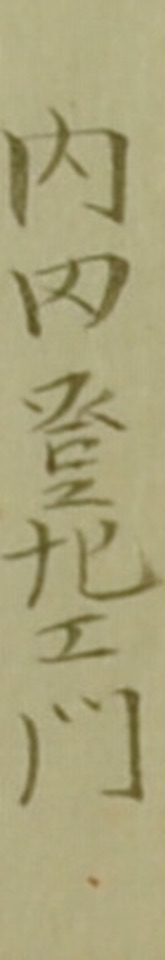内田登左エ門・
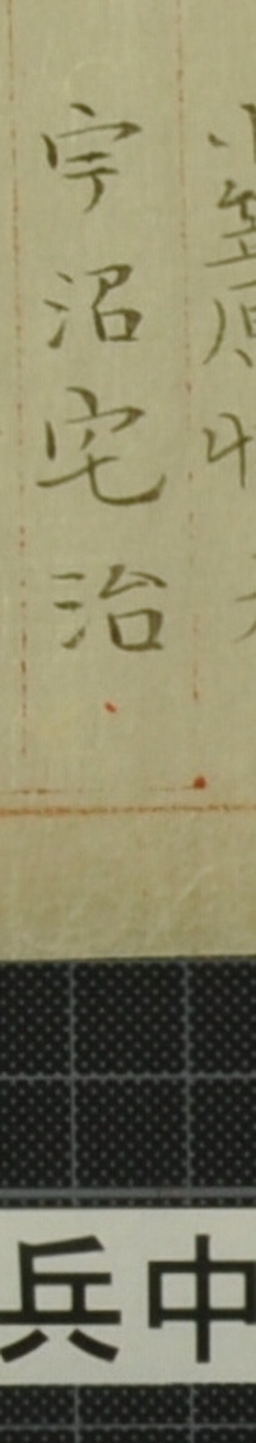宇沼宅治・
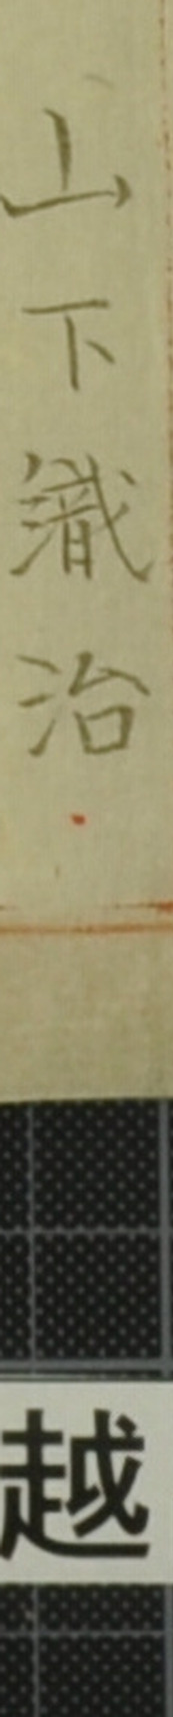山下織治・
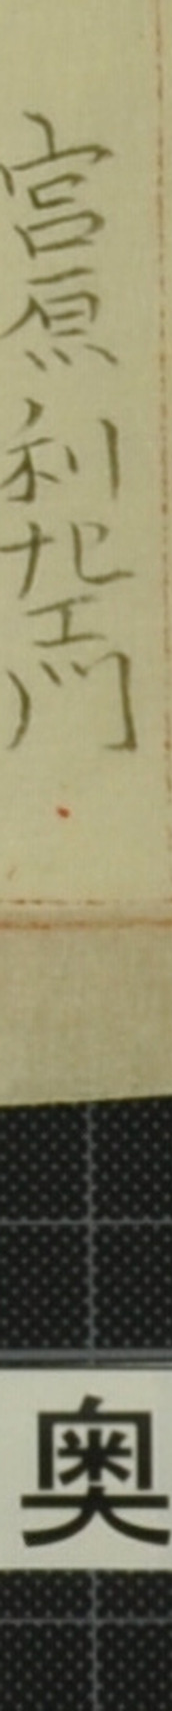宮原利左エ門・
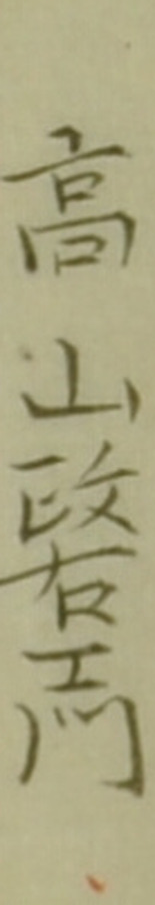高山政右エ門・
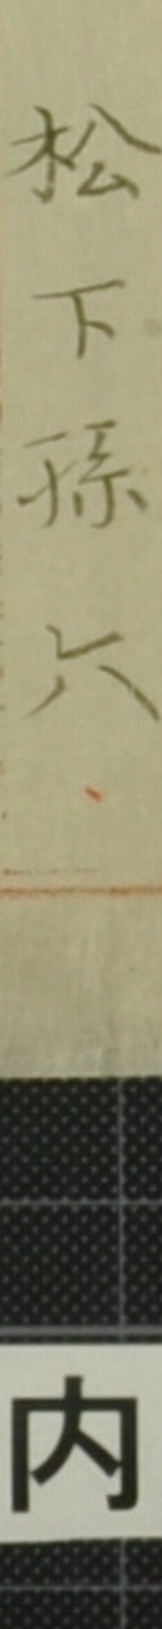松下孫六・
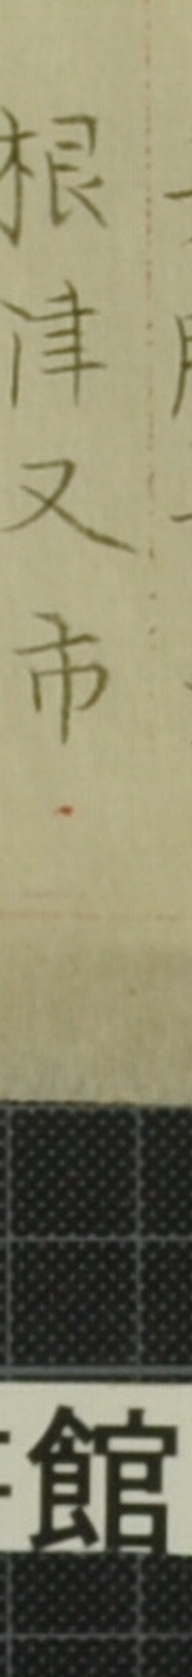根津又市・
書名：奥越出兵中戦争之事件概略抄録（控）
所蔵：伊那市立高遠町図書館・合同会社AMANE
